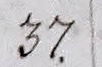37.
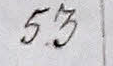53
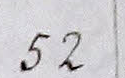52
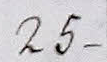25
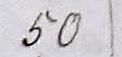50
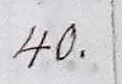40.
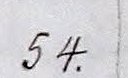54.
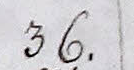36.
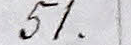51.
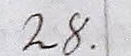28.
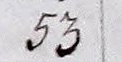53
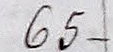65
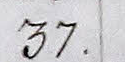37.
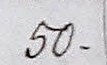50
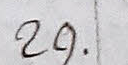29.
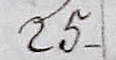25
